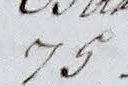75
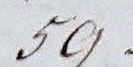59
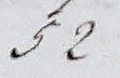50
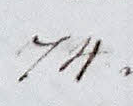74
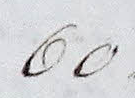60
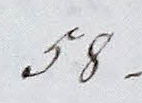58
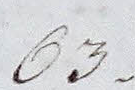63
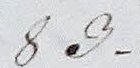83
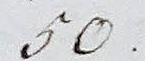50
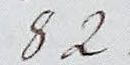82
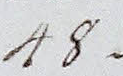48
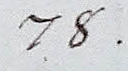78
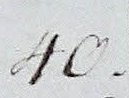40
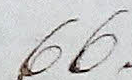66
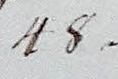48
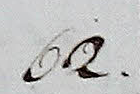62
